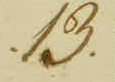13.
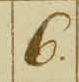6.
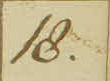18.
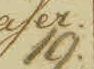19.
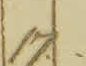17.
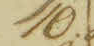10.
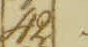42
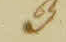3
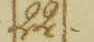22
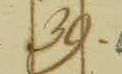39
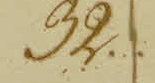32.
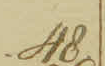48.
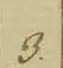3.
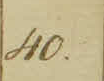40.
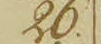26.
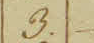3.
